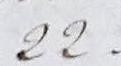22
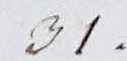31
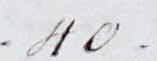40
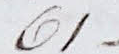61
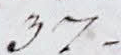37
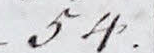54
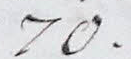70
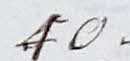40
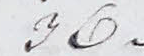36
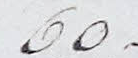60
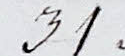31
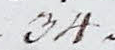34
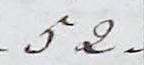52
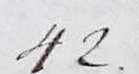42
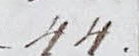44
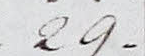29
